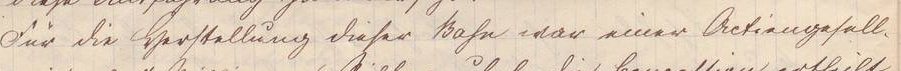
Für die Herstellung dieser Bahn war einer Actiongesell-
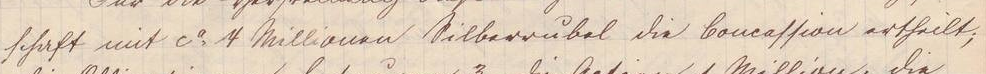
schaft mit ca 4 Millionen Silberrubel die Concession ertheilt,
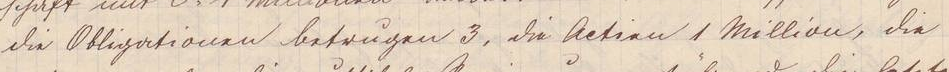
die Obligationen betrugen 3, die Actien 1 Million, die
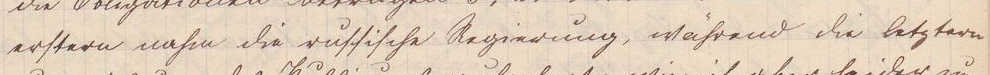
erstern nahm die russische Regierung, während die letztern
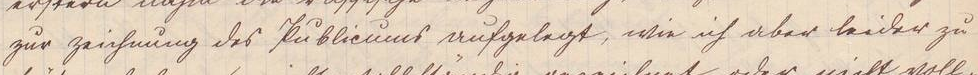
zur Zeichnung des Publicums aufgelegt, wie ich aber leider zu
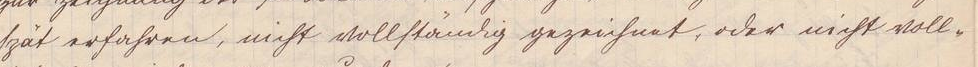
spät erfahren, nicht vollständig gezeichnet, oder nicht voll-
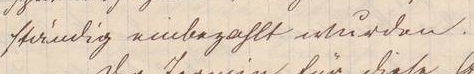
ständig einbezahlt wurden.
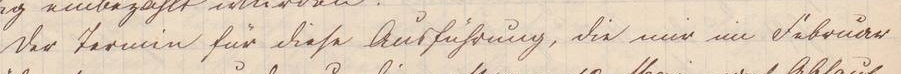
Der Termin für diese Ausführung, die mir im Februar
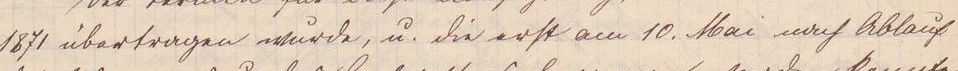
1871 übertragen wurde, u. die erst am 10. Mai nach Ablauf
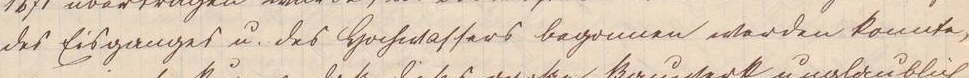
des Eisganges u. des Hochwassers begonnen werden konnte,
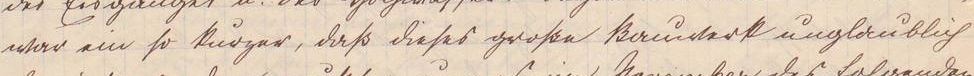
war ein so kurzer, daß dieses große Bauwerk unglaublich
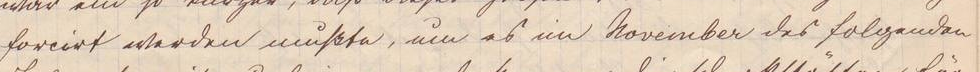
focirt werden mußte, um es im November des folgenden
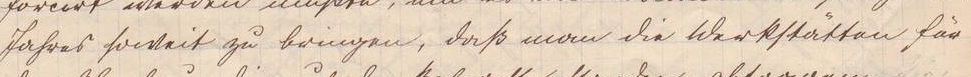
Jahres soweit zu bringen, daß man die Werkstätten für
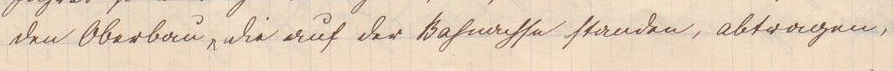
den Oberbau, die auf der Bahnachse standen, abtragen,
